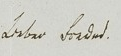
Lieber Freund.
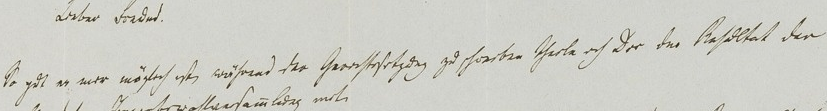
So gut es mir möglich ist, während der Gerichtssitzung zu schreiben theile ich Dir das Resultat der
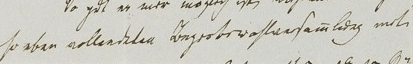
so eben vollendeten Bezirkswahlversammlung mit.
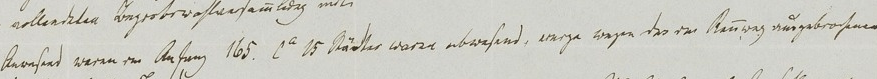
Anwesend waren im Anfang 165. Ca 15 Städter waren abwesend, einige wegen des im Rennweg ausgebrochenen
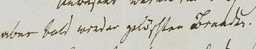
aber bald wieder gelöschten Brandes.
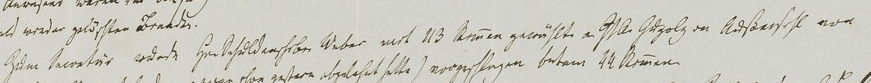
Zum Secretär wurde Hr. Schuldenschrbr. Weber mit 113 Stimmen gewählt a. G.A. Guzolg in Außersihl von
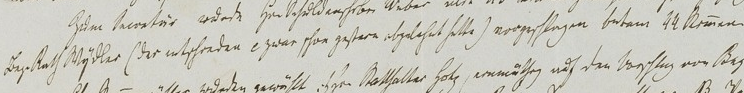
Bez.Rath Wydler (der entschieden & zwar schon gestern abgelehnt hatte) vorgeschlagen bekam 44 Stimmen.
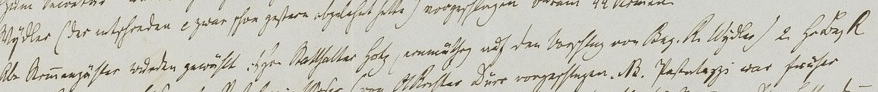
Als Stimmenzähler wurden gewählt Bzr.Statthalter Hotz (einmüthig auf den Vorschlag von Bez.R. Wydler) 2. Hr BezR
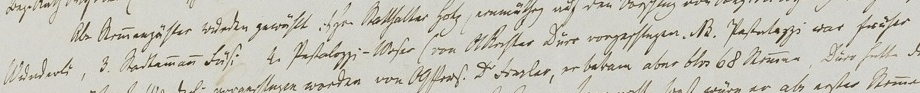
Wunderli, 3. Stadtammann Fäsi 4. Pestalozzi – Waser (von O.Richter Dürr vorgeschlagen. NB. Pestalozzi war früher
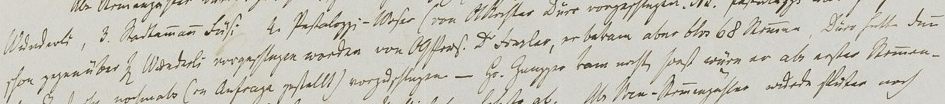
schon gegenüber Hrn Wunderli vorgeschlagen worden von OGPräs. Dr Finsler, er bekam aber blos 68 Stimmen, Dürr hatte dann
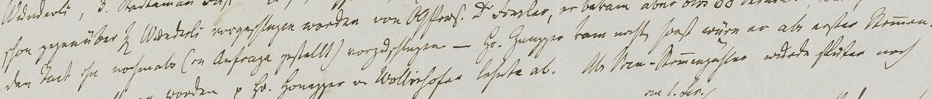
den Tact ihn nochmals (in Anfrage gestellt) vorzuschlagen – Hr. Zangger kam nicht, sonst wäre er als erster Stimmen-
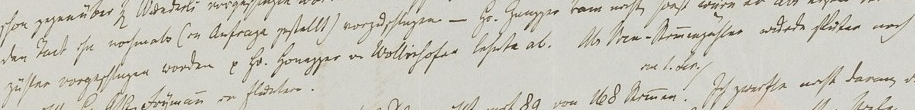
zähler vorgeschlagen worden & Hr. Honegger v. Wollishofen lehnte ab. Als Vice-Stimmenzähler wurde später noch
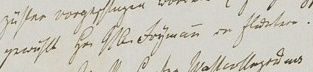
gewählt Hr. G.A. Frymann in Fluntern.
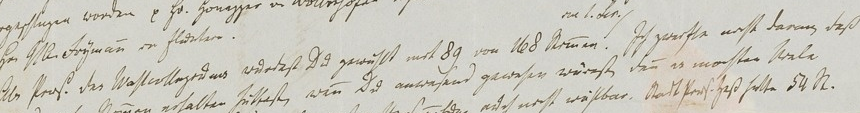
Als Präs. des Wahlcollegiums wurdest Du gewählt mit 89 von 168 Stimmen im 1. Scr. Ich zweifle nicht daran, daß
